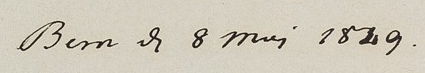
Bern den 8 Mai 1849.
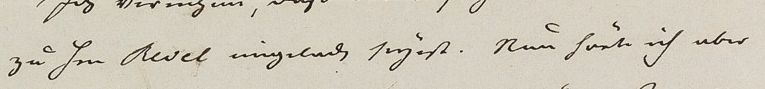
zu Hrn Revel eingeladen seyest. Nun hörte ich aber
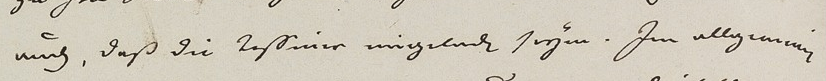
auch, daß die Tessiner eingeladen seyen. Im allgemeinen
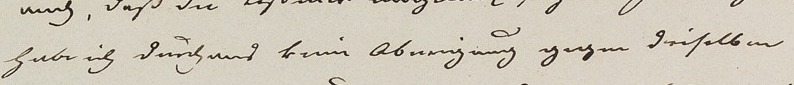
habe ich durchaus keine Abneigung gegen dieselben
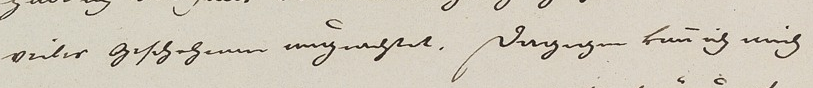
vieles Geschehenen ungeachtet. Dagegen kann ich mich
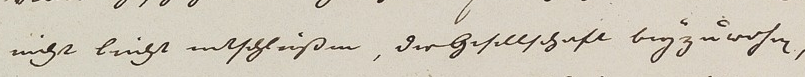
nicht leicht entschließen, der Gesellschaft beizuwohnen,
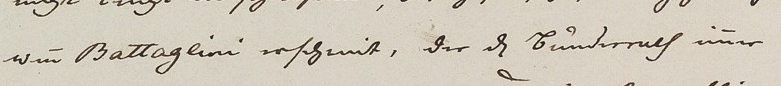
wenn Battaglini erscheint, der den Bundesrath immer
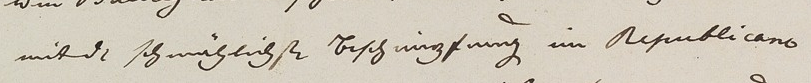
mit den schmählichsten Beschimpfungen im Republicano
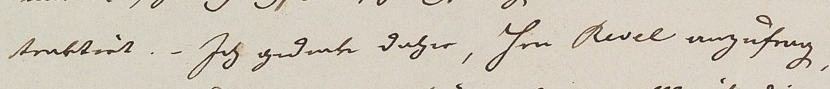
traktirt. – Ich gedenke daher, Hrn Revel anzufragen,
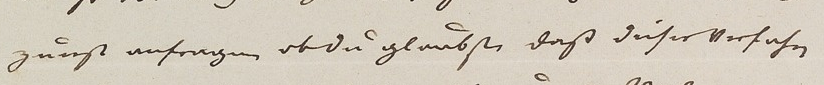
zuerst anfragen, ob du glaubst, daß dieses Verfahren
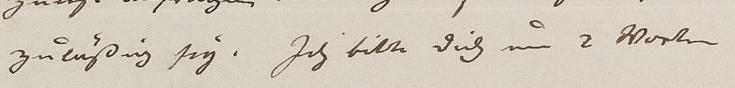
zuläßig sey. Ich bitte dich um 2 Worte.
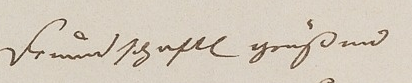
Freundschaftlich grüßend
